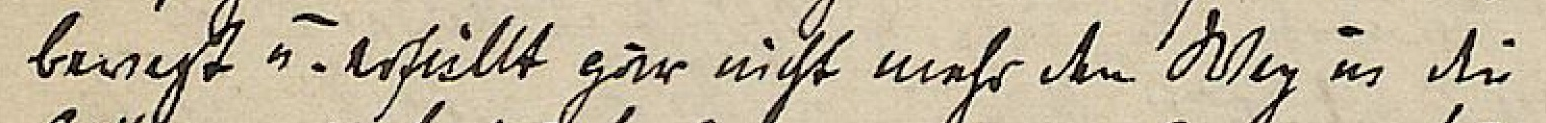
bewegt u. erfüllt gar nicht mehr den Weg in die
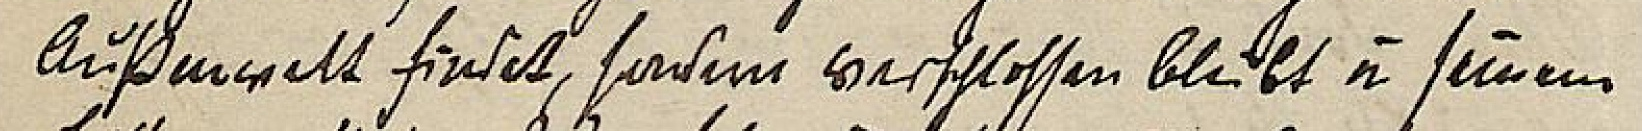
Außenwelt findet, sondern verschlossen bleibt in seinem
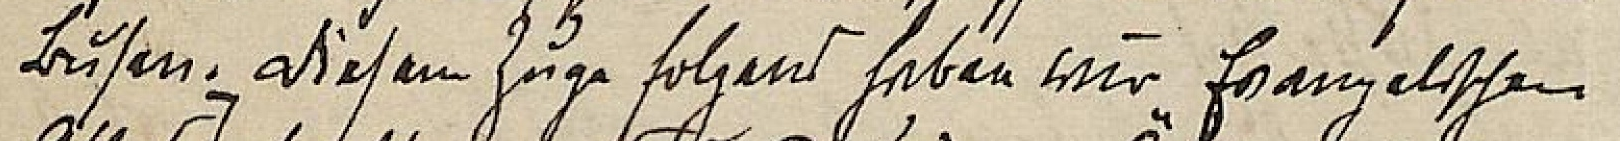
Busen. Diesem Zuge folgend haben wir Evangelischen
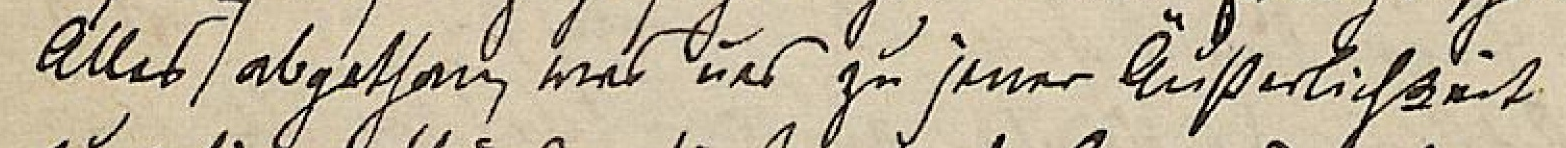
Alles] abgethan, was uns zu jener Äußerlichkeit
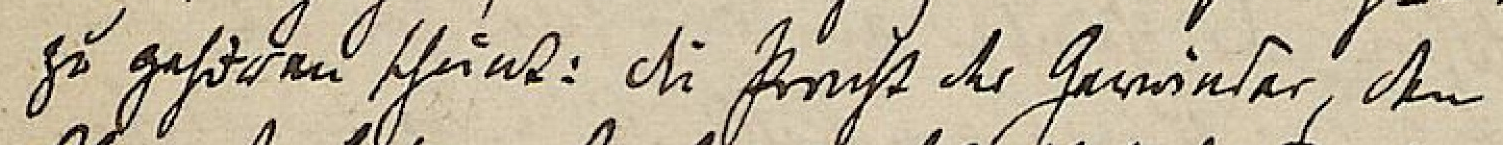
zu gehören scheint: die Pracht der Gewänder, den
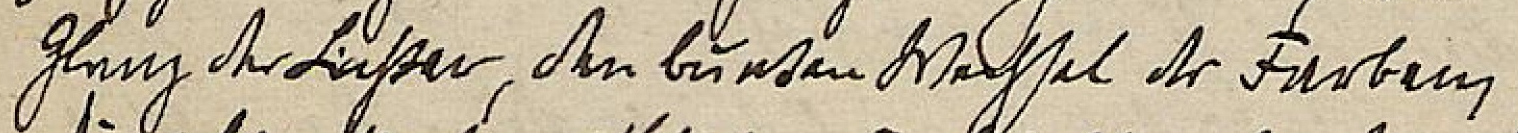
Glanz der Lichter, den bunten Wechsel der Farben,
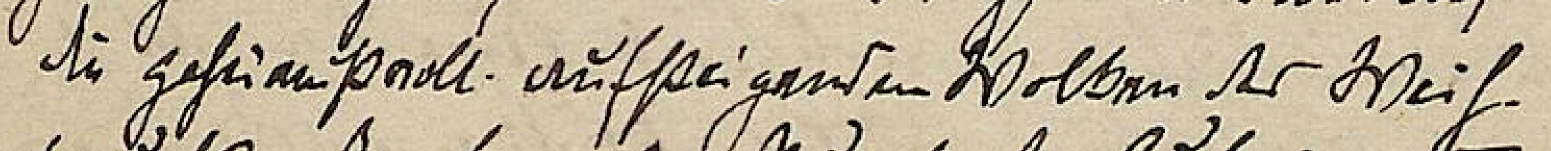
die geheimnisvoll aufsteigenen Wolken des Weih¬
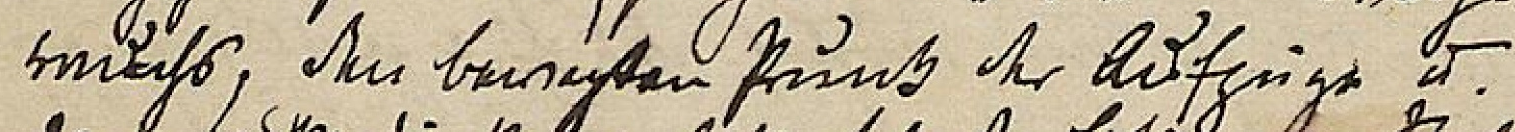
rauchs, den bewegten Prunk der Aufzüge u.
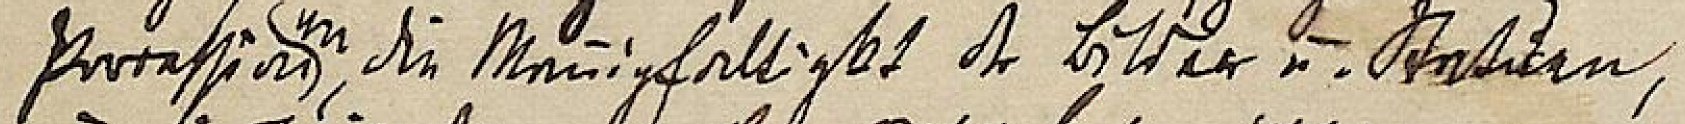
Processionen, die Manigfaltigkt der Bilder u. Statuen,
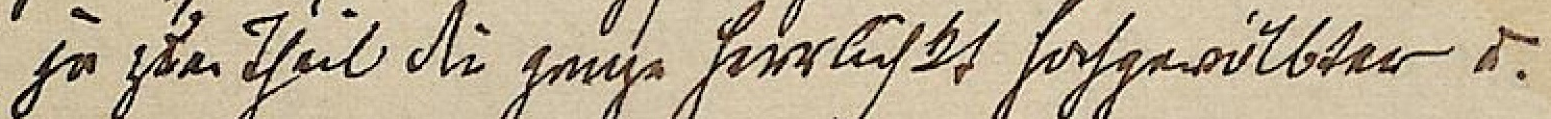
ja zum Theil die ganze Herrlichkt. hochgewölbter u.
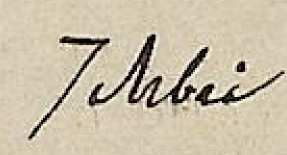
dabei
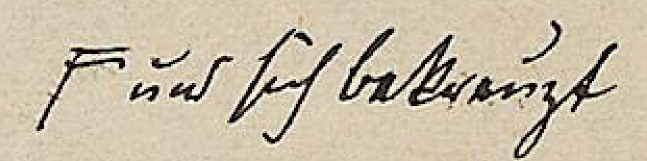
und sich bekreuzt
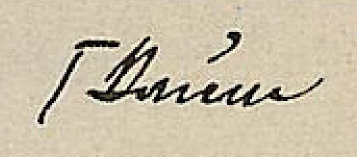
keinen
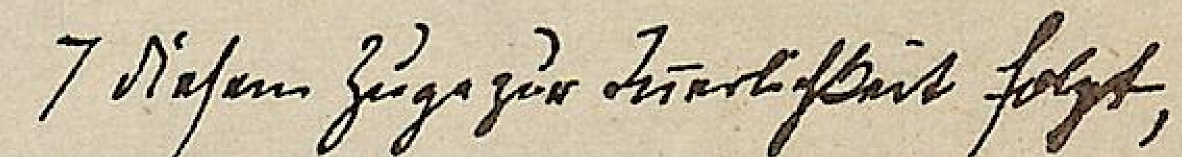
diesem Zuge zur Inerlichkeit folgt
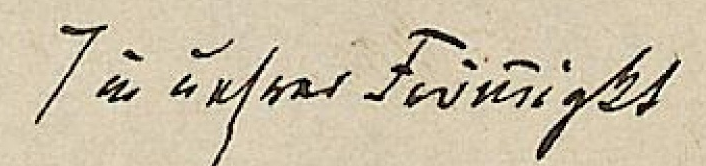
in unsrer Frömigkt
